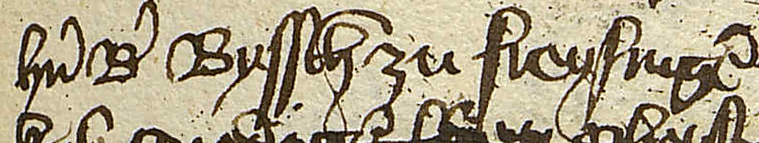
hn* B* Byſſch* cʒu freyſinge*
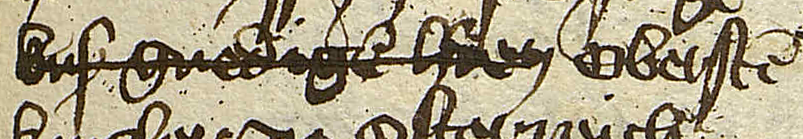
vnſ* gnedige* hr*en Oberſte*
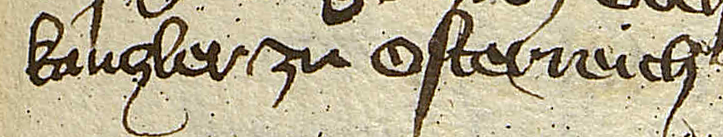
kancʒler cʒu Oſterreich
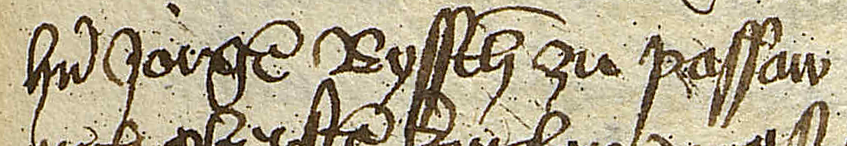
hn* Iörge* Byſſch* cʒu paſſaw
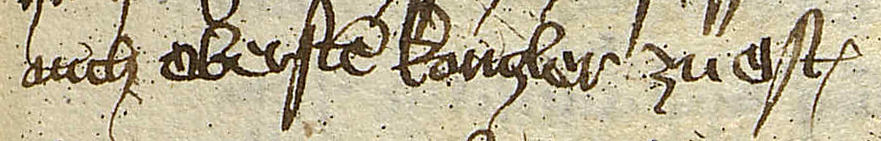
auch Oberſte* kancʒler cʒu Oſt*
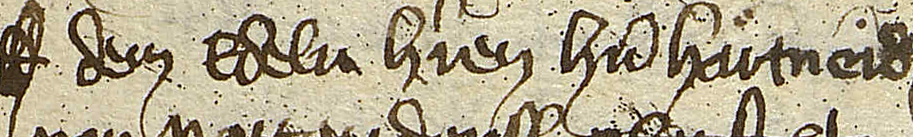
% dem Edeln h*ren hn* Hartneid
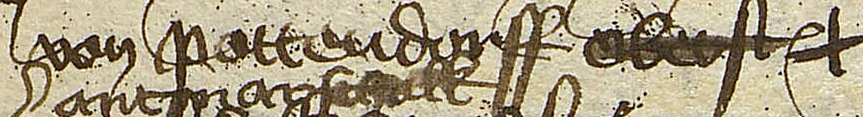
von Pottendorff Oberſt*
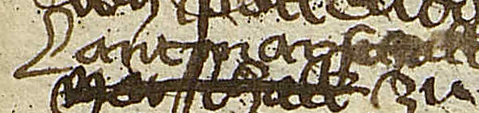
Lantmarſchalk
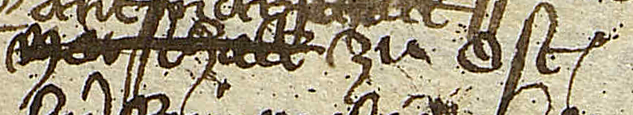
marſchalk cʒu Oſt*
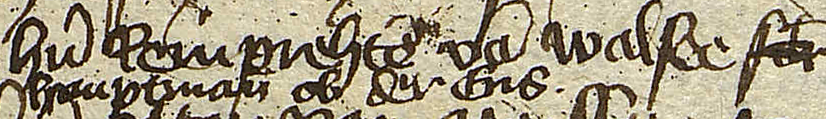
hn* Reinprehte vo* walſee ſilr*
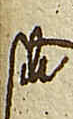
ſilr*
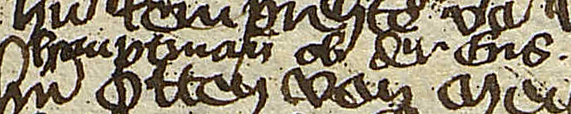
hauptman ob der Ens
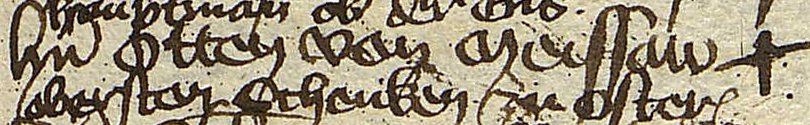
hn* Otten von Meiſſaw
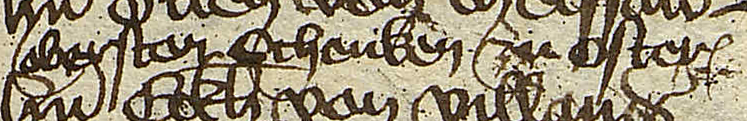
oberſten Schenken cʒu Oſter*
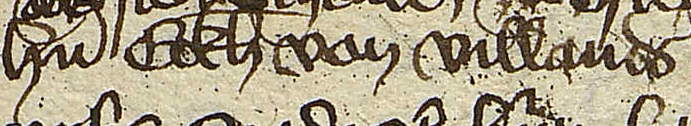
hn* Eckh* von villands*
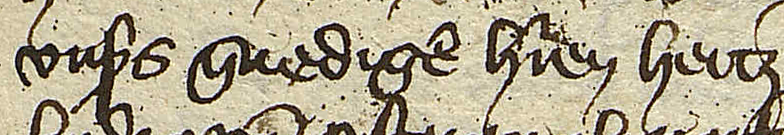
vnſ*s gnedige* hr*en hercʒ*
